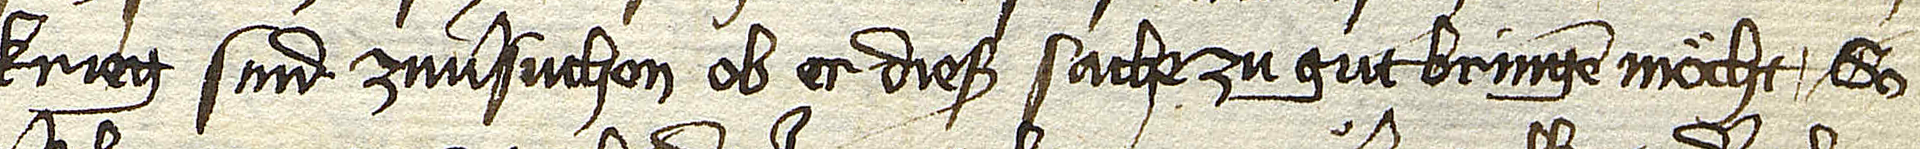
krieg ſind ʒuu*ſuchen ob er dieſ* ſache ʒu gut bringe* möcht / So
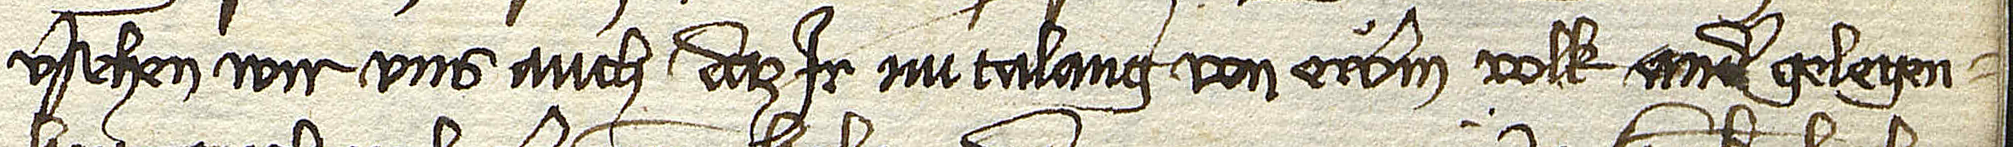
v*ſtehen wir vns auch / daʒ Ir nu talang von ew*m volk and* gelegen =
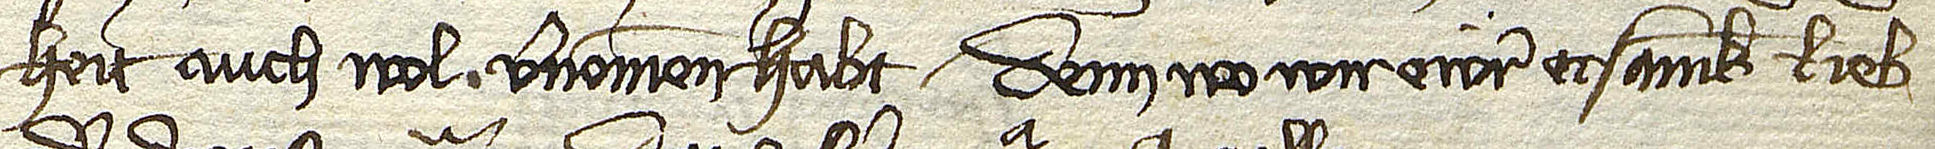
heit auch wol v*nom*en habt / Denn wo wir ew*r erſamk* lieb
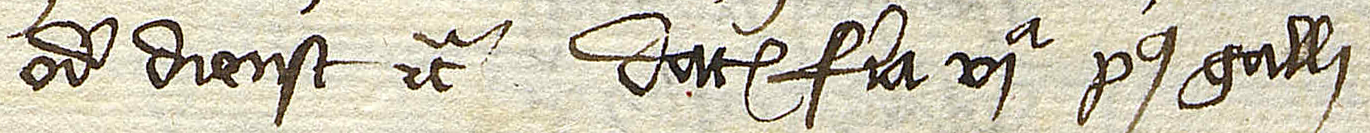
od* dienſt ec* Dat* fia* vi* p* galli
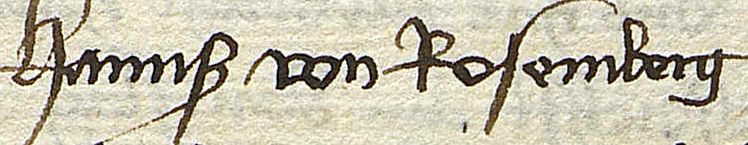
Hannſ* von Roſemberg
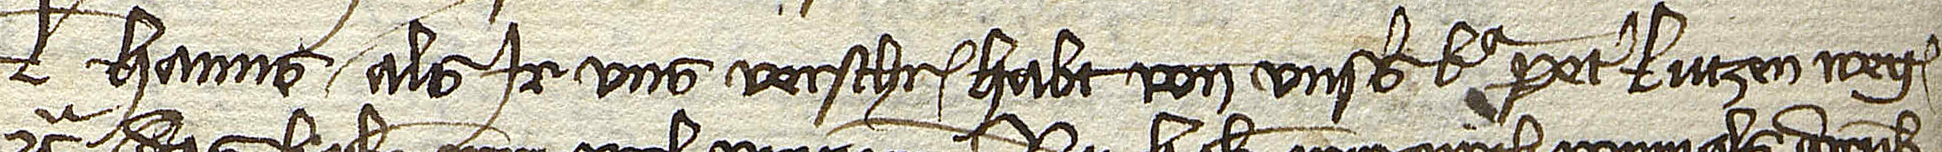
L* hanns / als Ir vns verſchr* habt von vnſ*s b* Pet* lucʒen weg*
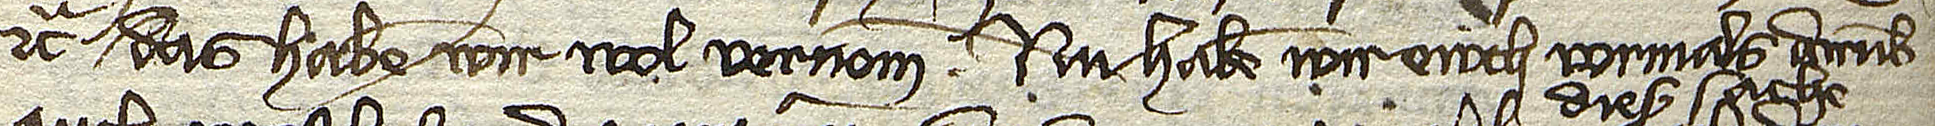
ec* / das habe* wir wol vernom* . Nu hab* wir ewch vormals darub*
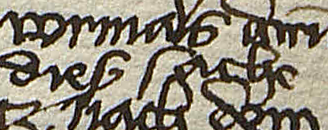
dieſ* ſache
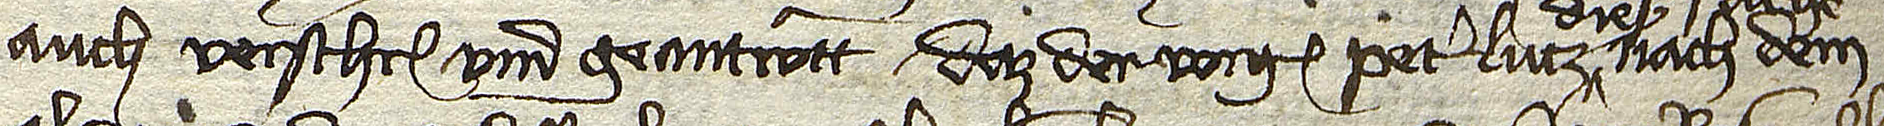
auch verſchr* vnd geantw*tt / daʒ der vorg* pet* lucʒ nach dem
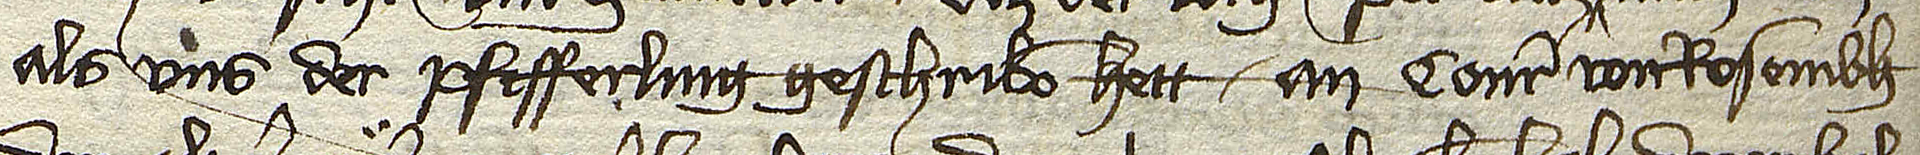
als vns der pfifferling geſchribe* hett* / an Conr* von Roſemb*g
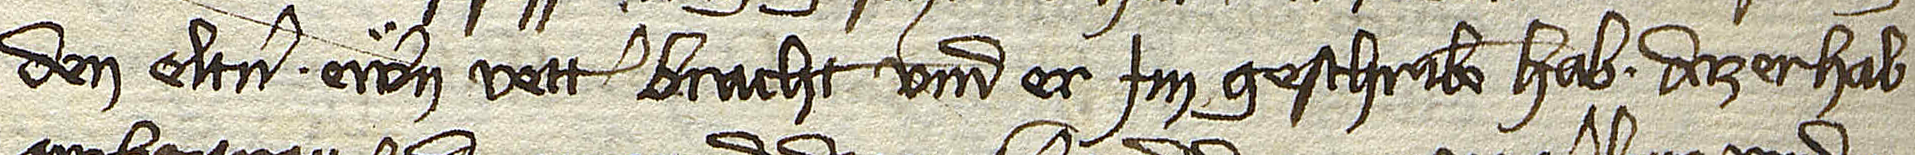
den etl*n . ew*n vett* bracht vnd er Im geſchribe* hab . daʒ er hab
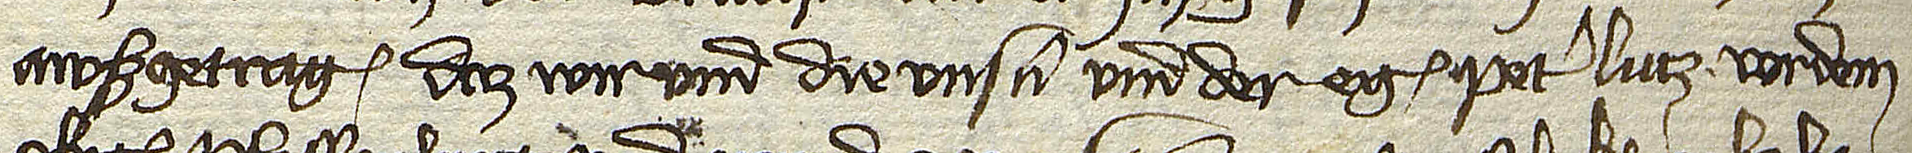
awſʒgetrag* daʒ wir vnd die vnſ*n vnd der eg* pet* lucʒ . vor dem
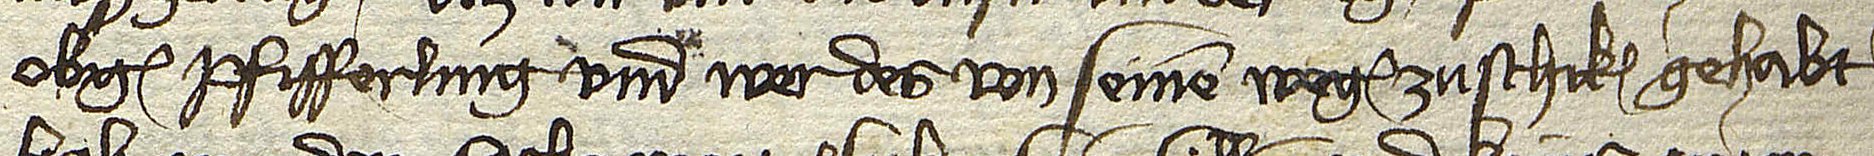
obg* Pfifferling vnd wer des von ſeine* weg* ʒu ſchik* gehabt
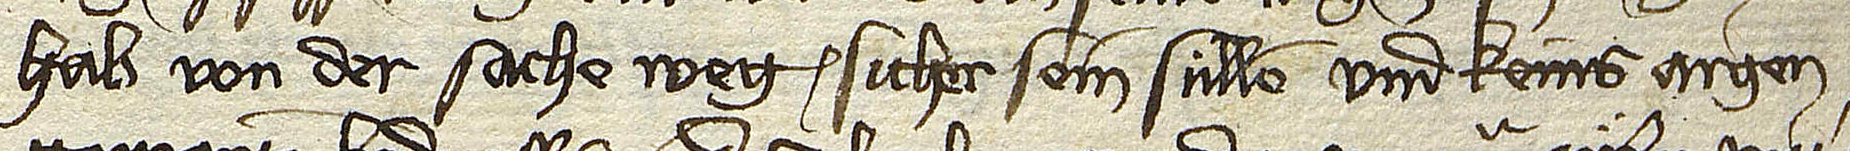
hab von der ſache weg* ſicher ſein ſülle* vnd keins argen
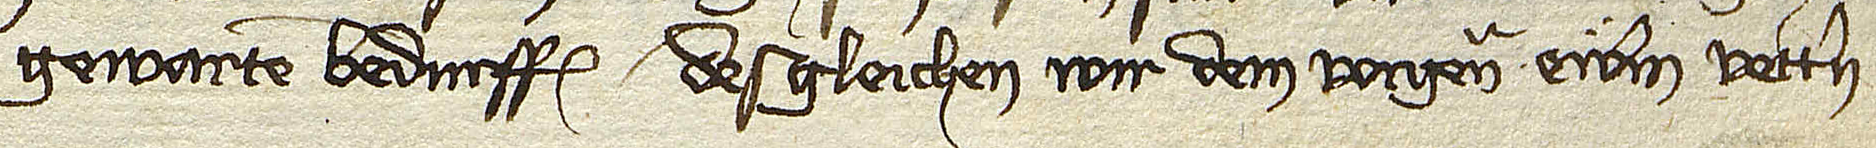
gewarte* bedurff* / deſgleichen wir dem vorgen* ew*m vett*n
